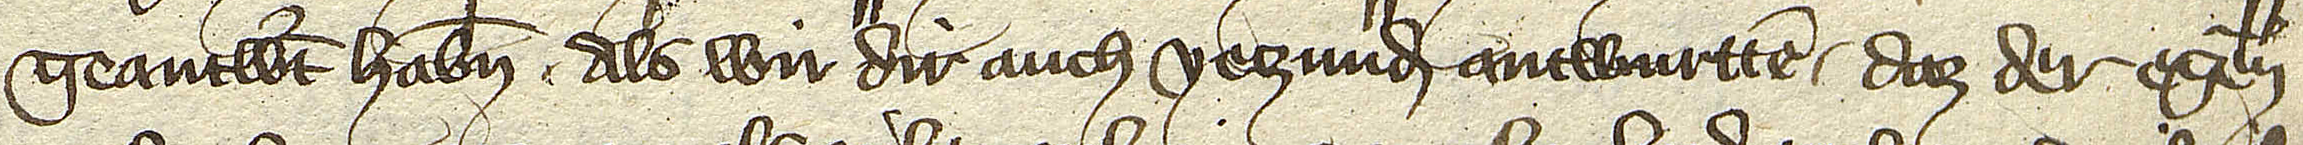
geantwt* habn* / Als wir dir auch yecʒund* antwurtte* / daʒ der egen*
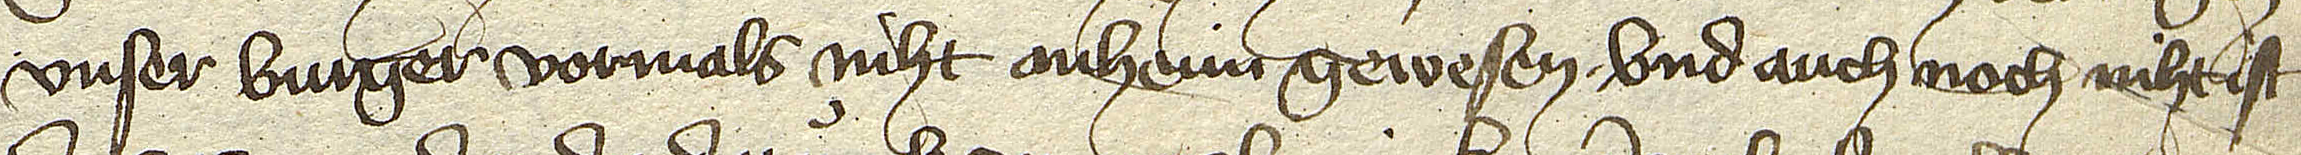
vnſer burger vormals niht anheim geweſen / vnd auch noch niht iſt
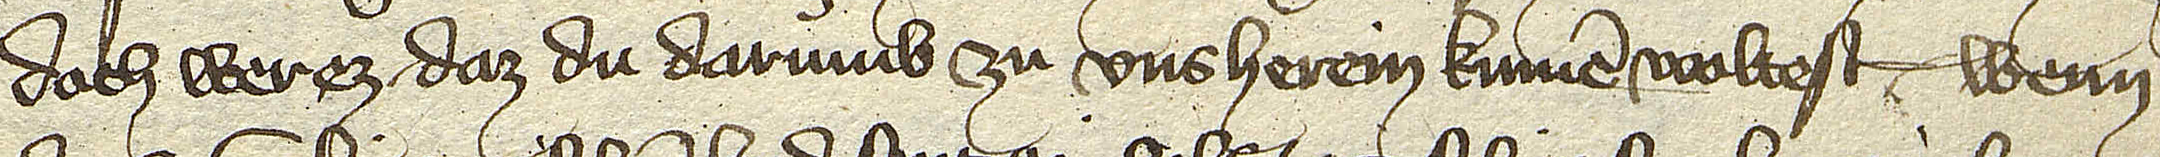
doch wer eʒ / daʒ du darümb cʒu vns herein kume* wolteſt / wenn
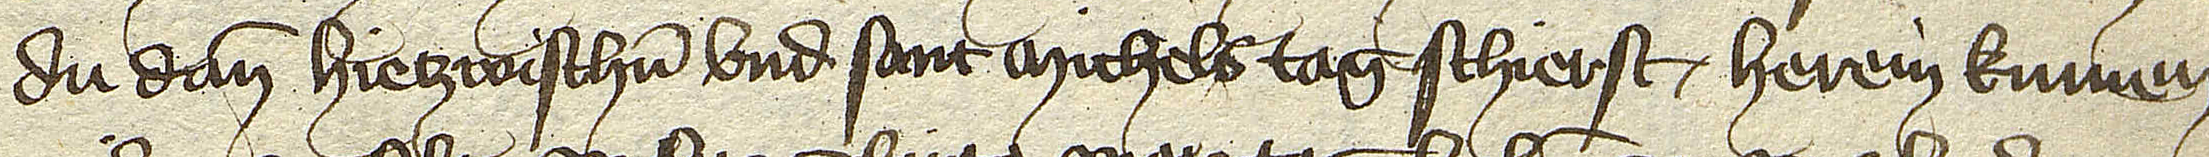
du dan* hiecʒwiſchn* vnd ſant Michels tag ſchierſt / herein kumen
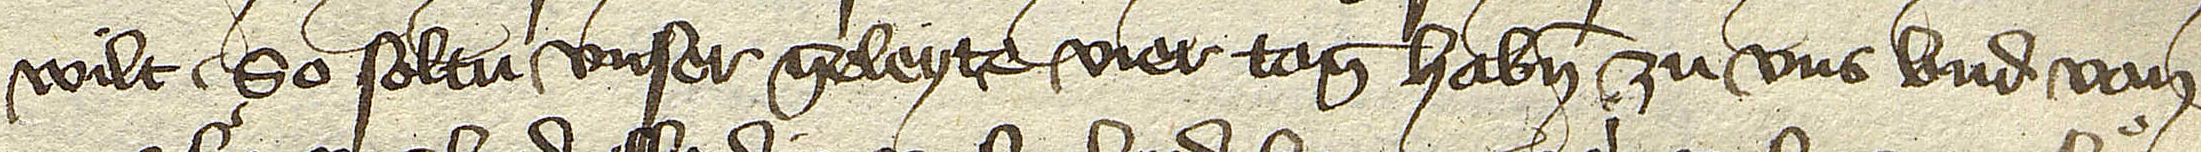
wilt / So ſoltu vnſer geleyte vier tag habn* cʒu vns vnd von
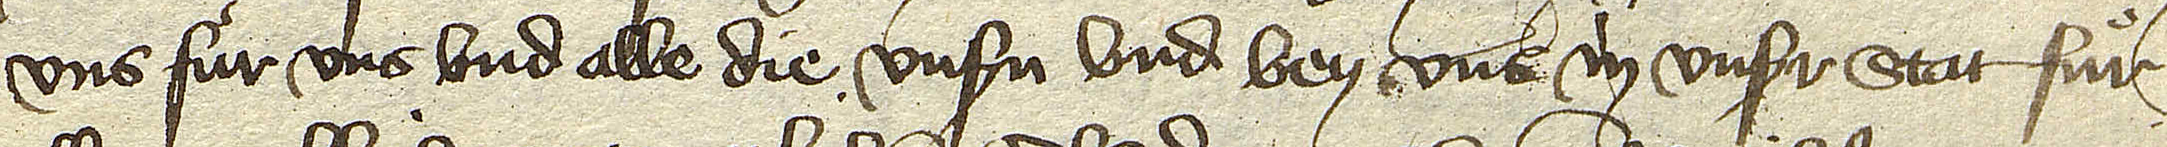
vns für vns vnd alle die vnſ*n vnd bey vns in vnſ*r Stat für
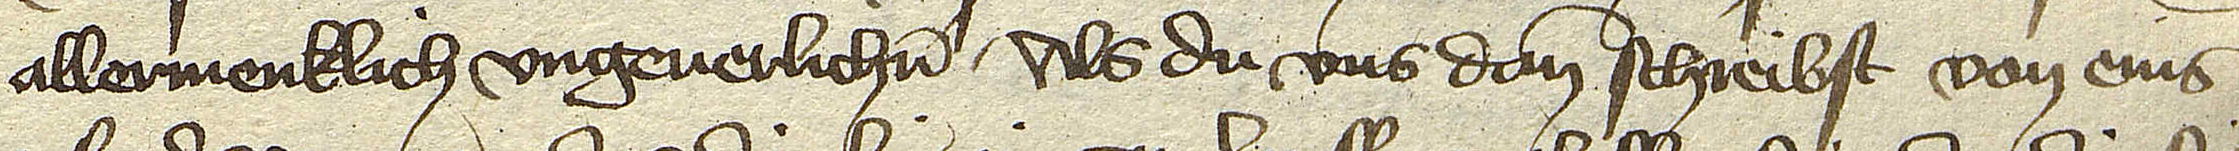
allermenklich vngeuerlichn* / Als du vns dan* ſchreibſt von eins
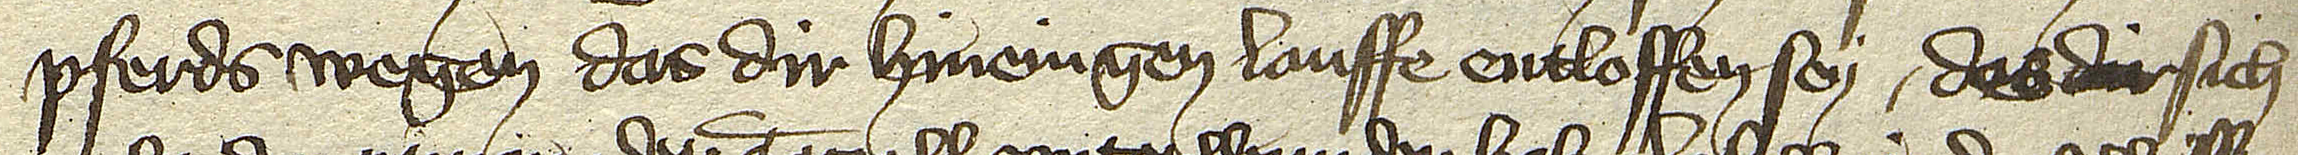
pferds wegen das dir hinein gen lauffe entloffen ſey / des dir ſich
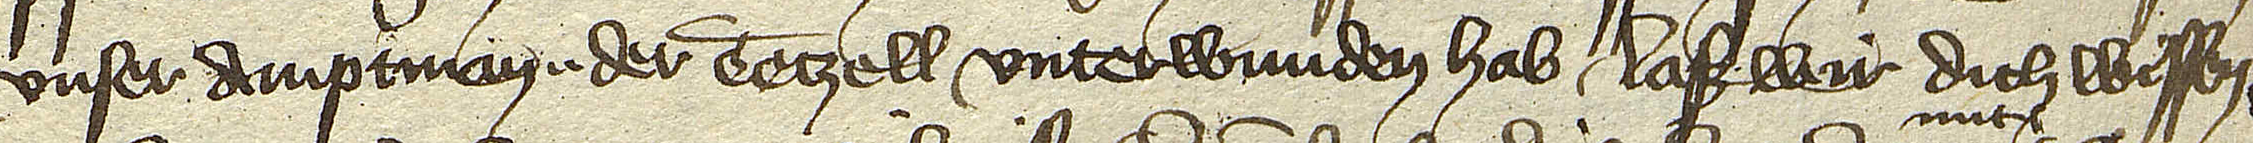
vnſer Amptman ~ der Tecʒell vnterwunden hab / laſʒ wir dich wiſſen
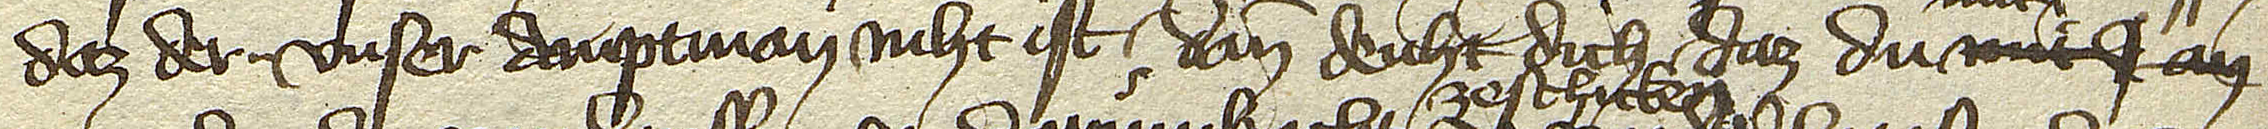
daʒ der ~ vnſer Amptman niht iſt / dan* deuht dich / daʒ du mit I an
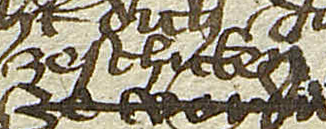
cʒeſchicken
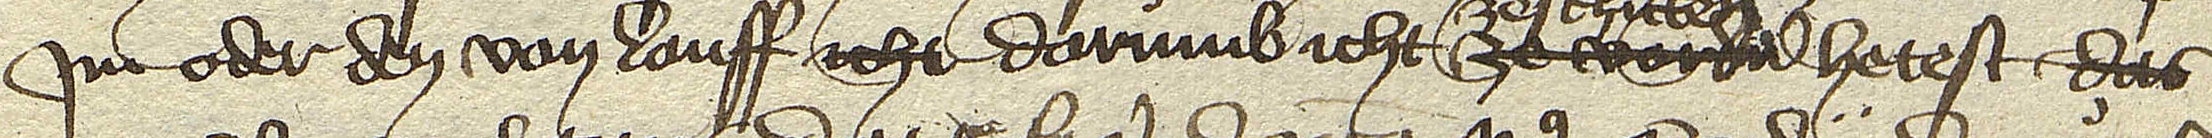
Im oder den von lauff icht darümb icht cʒe vordn* heteſt / das
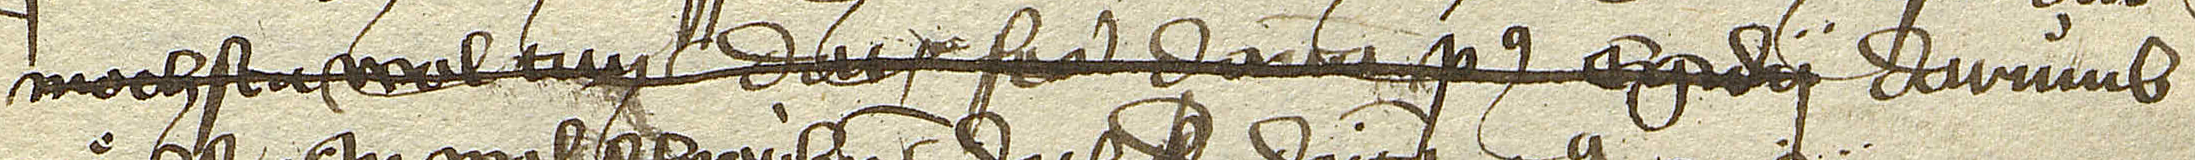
mochſtu wol tun / dat* fea* doica p* Egidii darümb
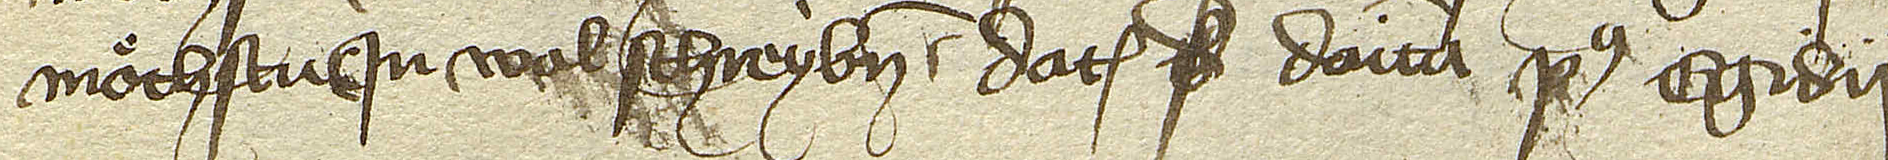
möchſtu In wol ſchreybn* / dat* d doica* p* Egidii
